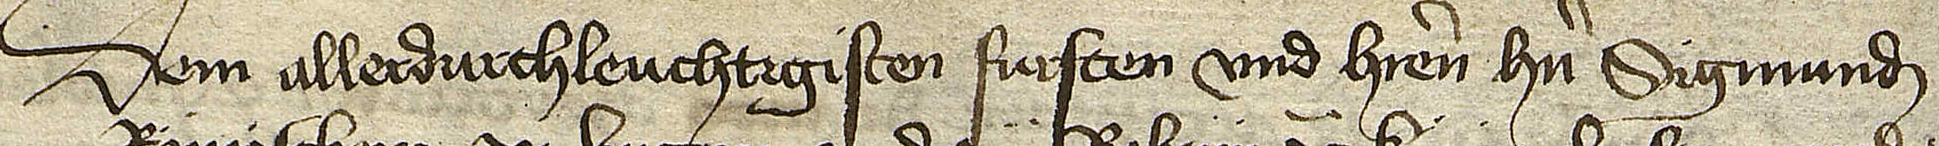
Dem allerdurchleuchtigiſten furſten vnd h*ren h*n Sigmund*
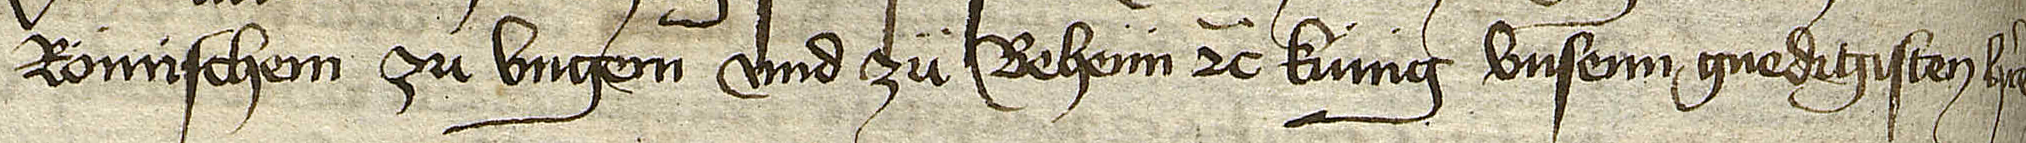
Römiſchem cʒu Vngern vnd cʒü Beheim ec* künig vnſerm gnedigiſten h*re%
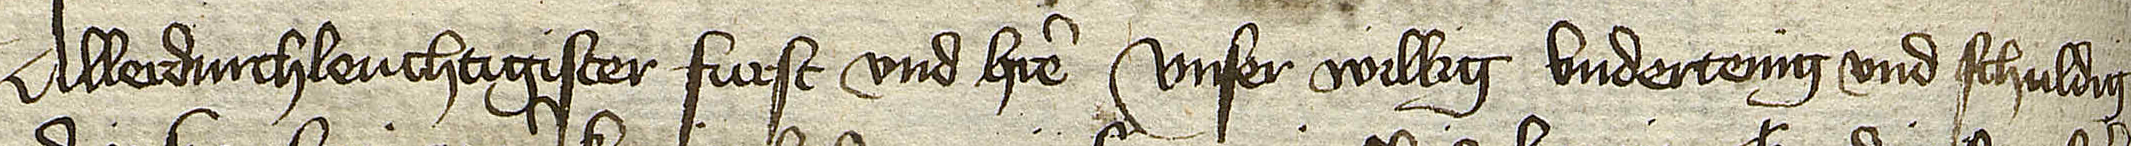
Allerdurchleuchtigiſter furſt vnd hre* Vnſer willig vndertenig vnd ſchuldig
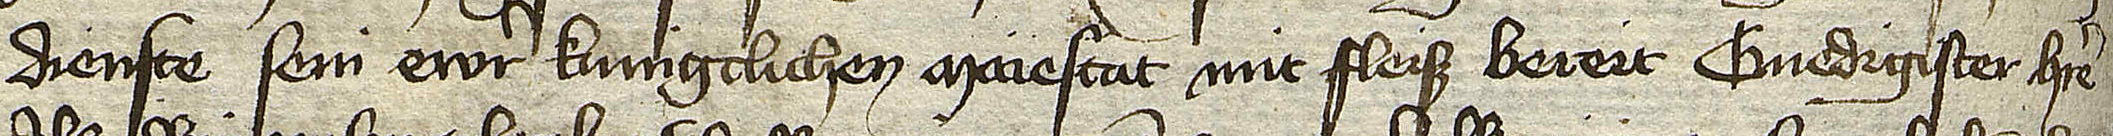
dienſte ſein ewr* kunigclichen Maieſtat mit fleiſʒ bereit Gnedigiſter h*re
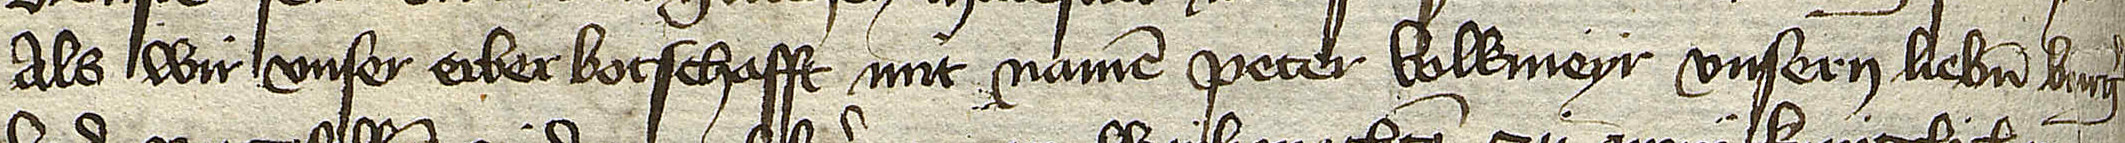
Als wir vnſer erber botſchafft mit name* peter Volkmeyr vnſern lieb*n burg*
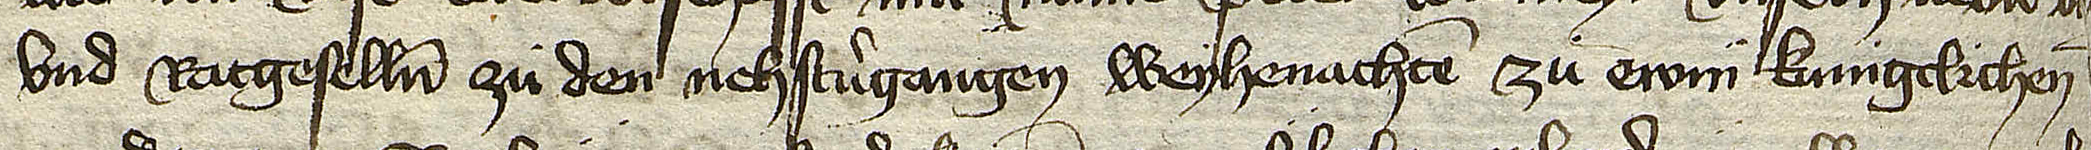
vnd Ratgeſell*n cʒu den nehſtu*gangen weyhenachte* ʒu ewrn kunigclichen
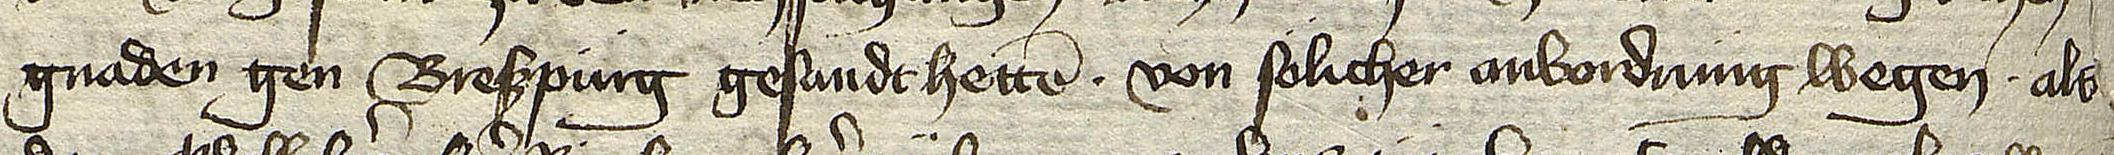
gnaden gen Breſʒpürg geſandt hette* . von ſölicher anvordrüng wegen . als
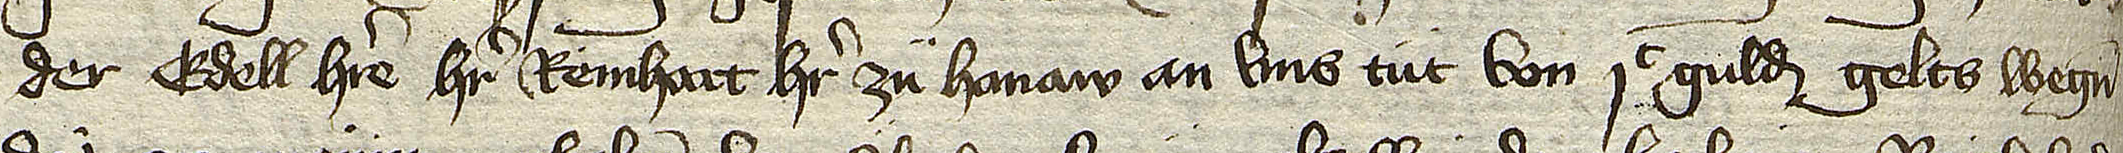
der Edell hr*e h*r Reinhart h*r cʒü hanaw an vns tüt von i* guld* gelts weg*n
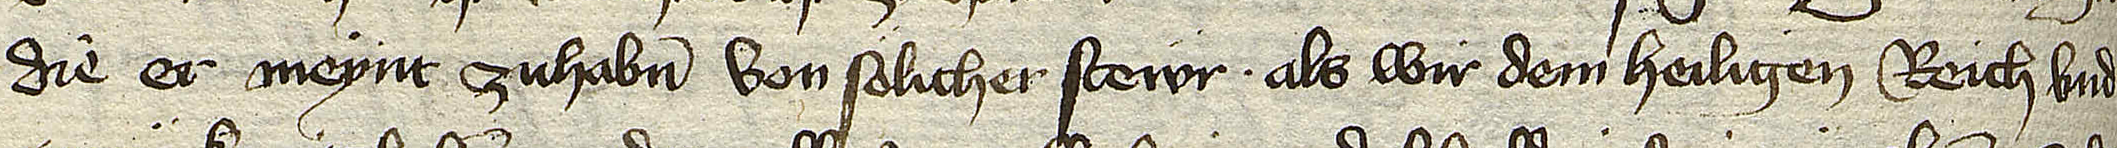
die er meynt cʒuhab*n von ſölicher ſteẅr . als wir dem heiligen Reich vnd
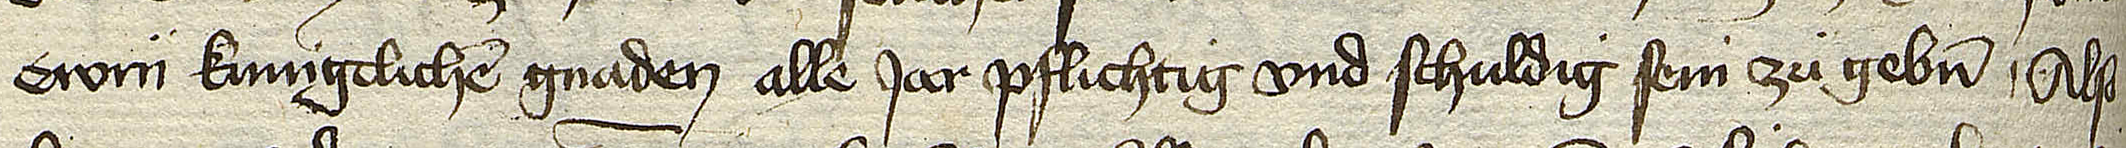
ewrn* kunigcliche* gnaden alle Iar pflichtig vnd ſchuldig ſein cʒü geb*n / Alſo
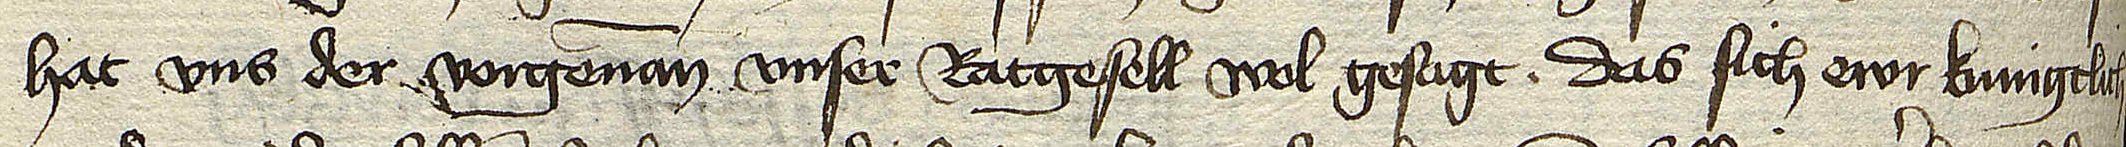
hat vns der vorgenan* vnſer Ratgeſell wol geſagt . Das ſich ewr kunigclich
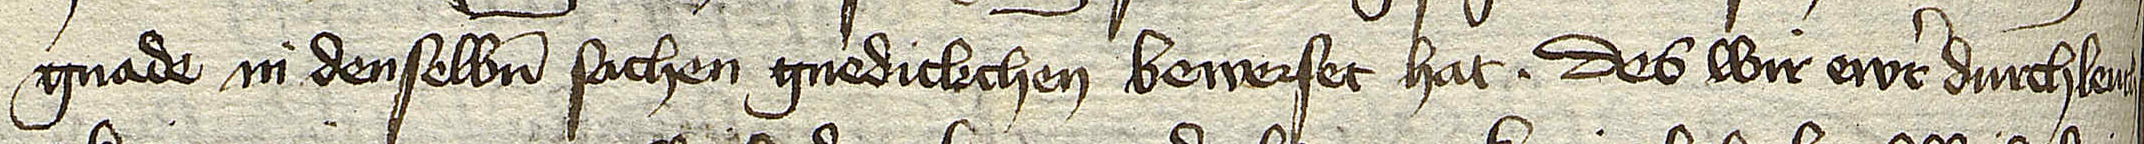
gnade in denſelb*n ſachen gnediclichen beweiſet hat . beweiſet hat . Des wir ewr* durchleuch
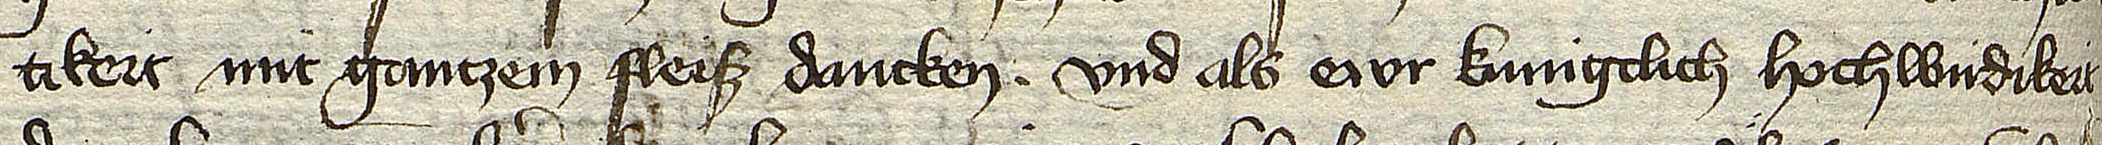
tikeit mit gancʒem fleiſʒ dancken . vnd als ewr kunigclich hochwirdikeit
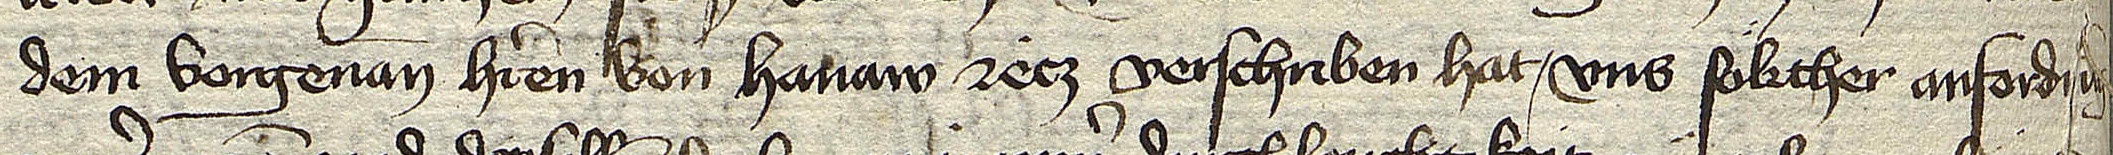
dem vorgenan* hren* von hanaw iecʒ verſchriben hat / vns ſölicher anfordru*g
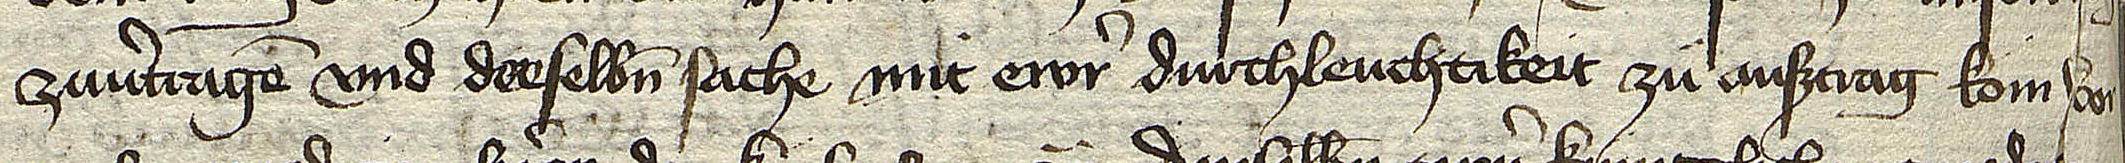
ʒuu*trage* vnd dieſelb*n ſache mit ewr* durchleuchtikeit cʒü auſʒtrag köm vor
